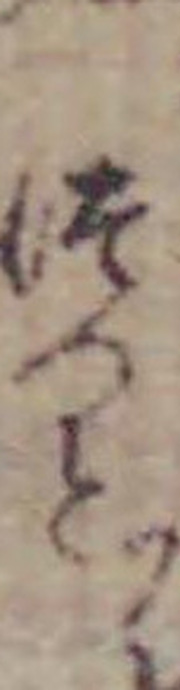つつと
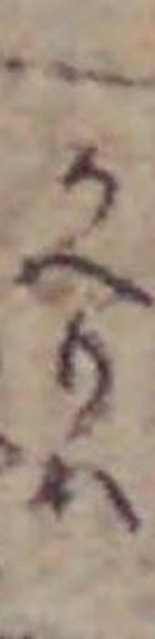かへりは
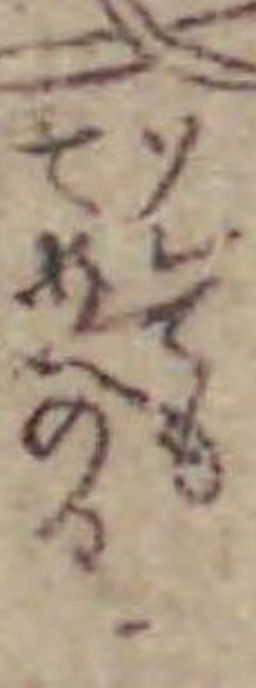てめへのる
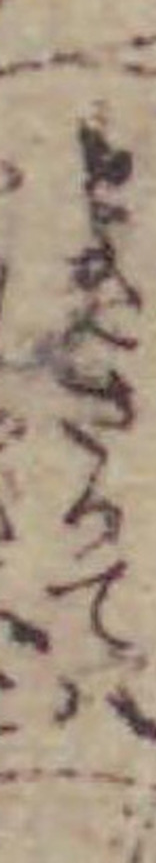ときさかては
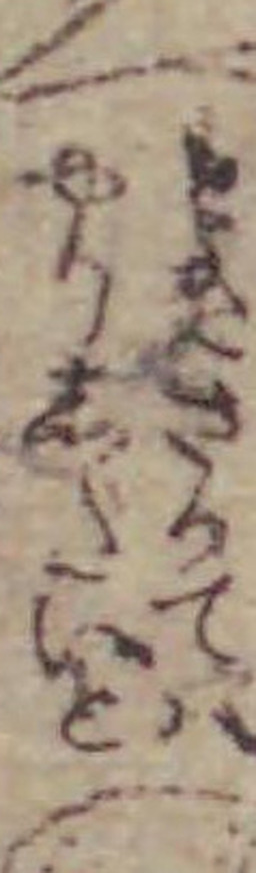やりしだいと
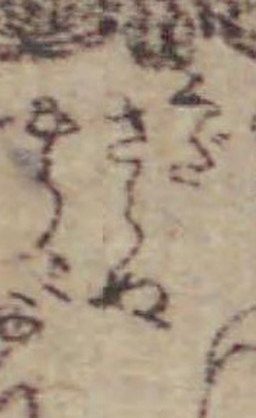さらぬ

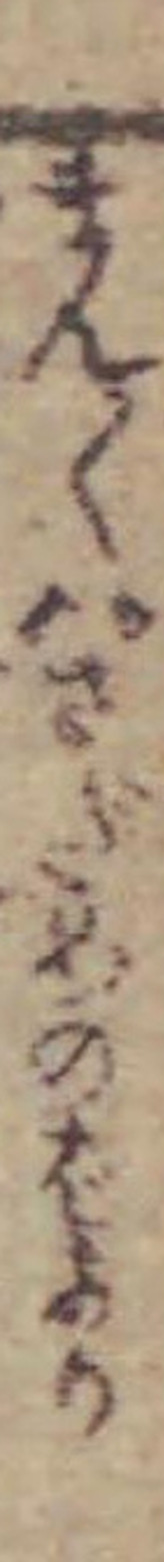まん〳〵はさだめのばより
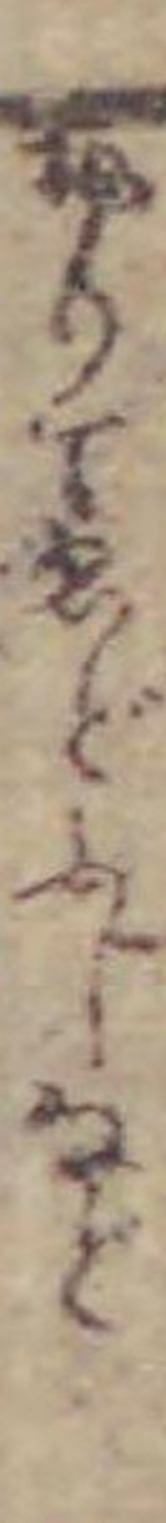おりてゑどふしなど
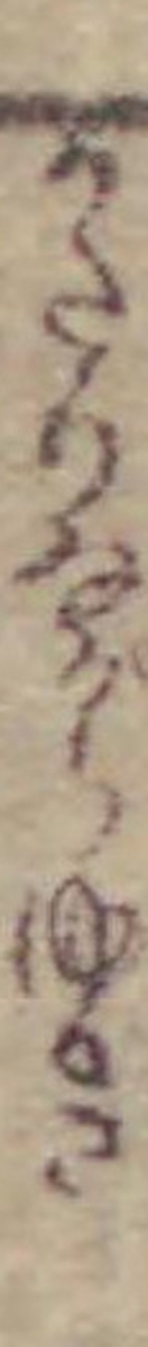かたりながらゆき
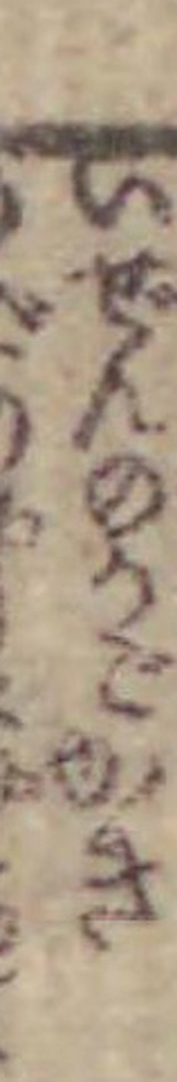いぜんのかごかき
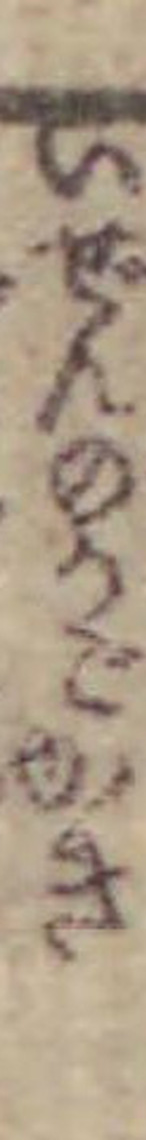いぜんのかごかき
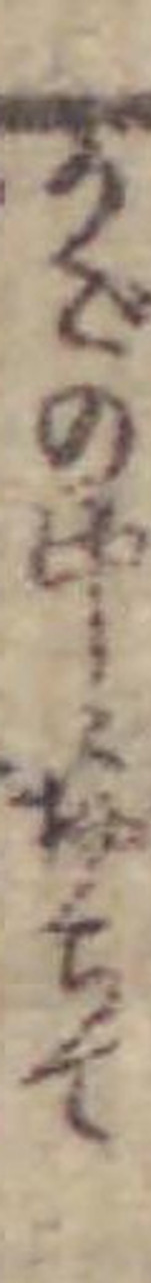かごの中におちて
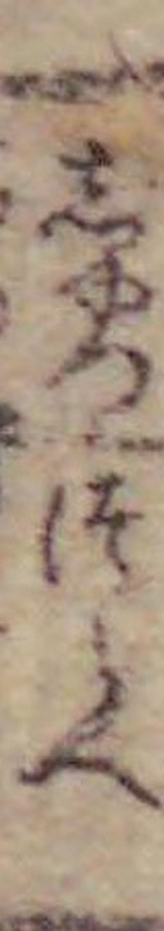しやつつらへ
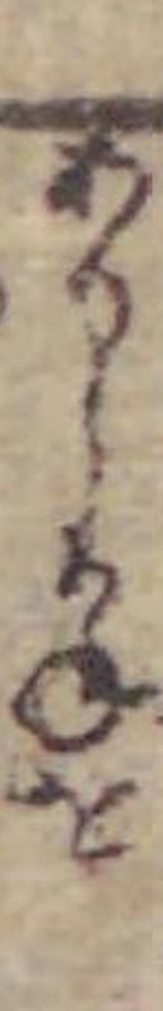ありしかねを
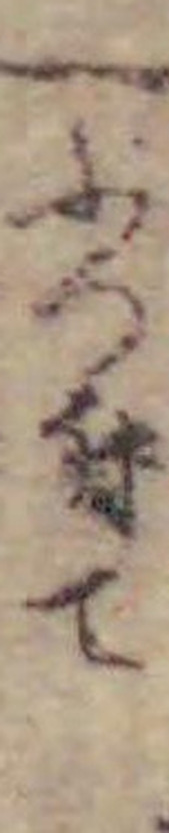ぶつ付て
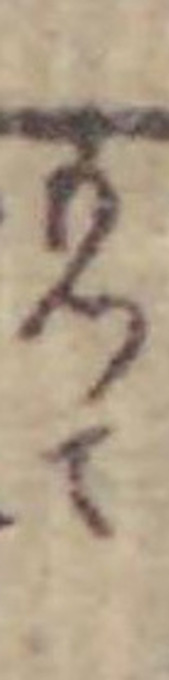もつて
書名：莫切自根金生木 : 3巻
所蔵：国立国会図書館 National Diet Library, JAPAN
